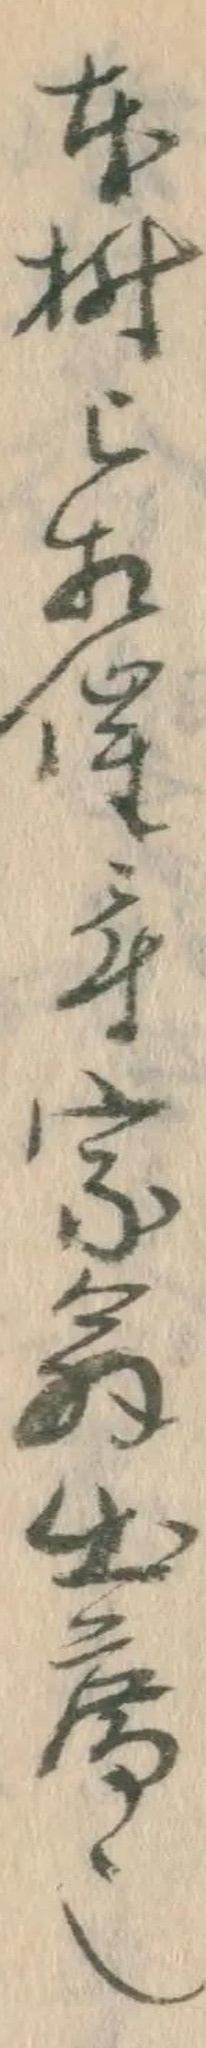本柑被相催ニ付家翁出席也
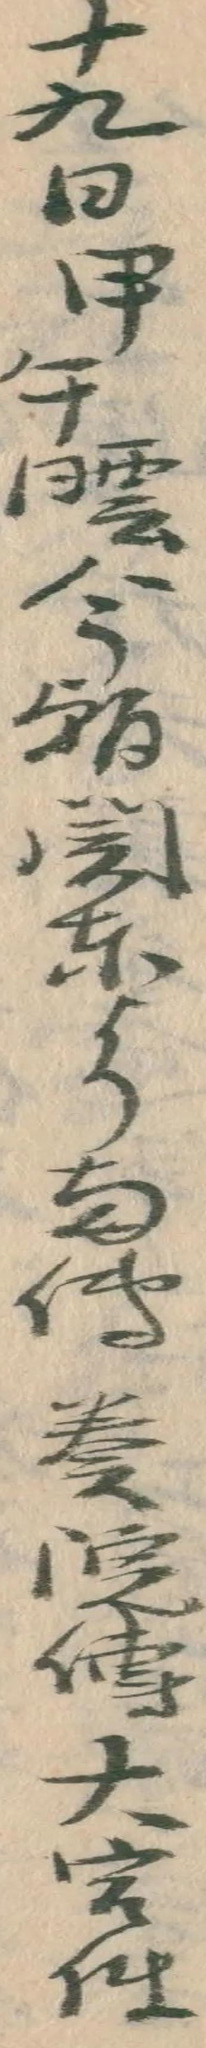十九日甲午雲今朝関東より両傳奏院傳大宮使
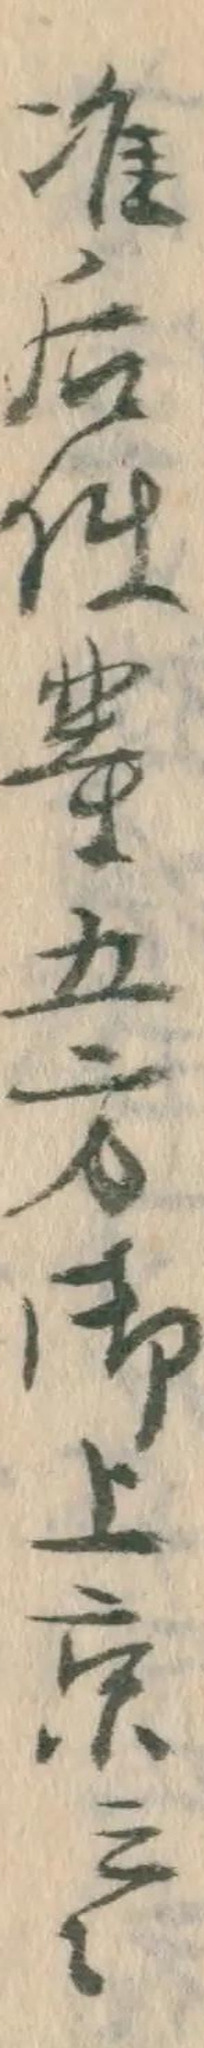准后使等五方御上京云々
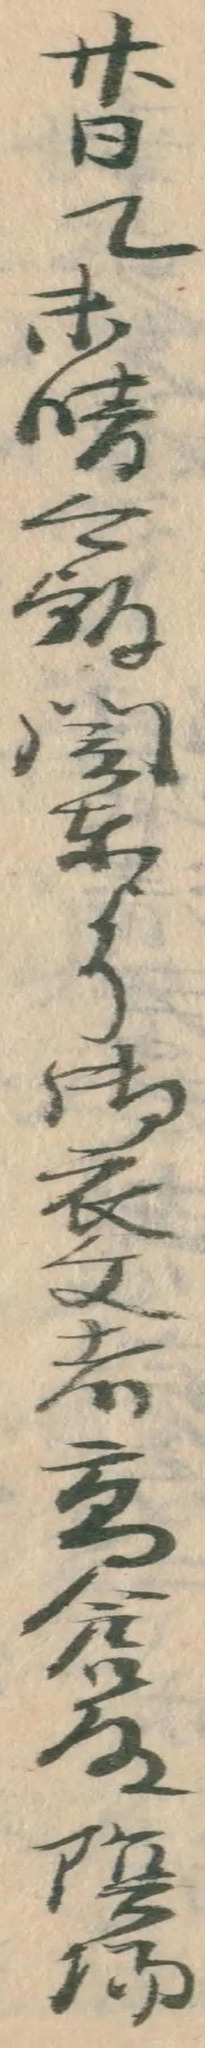廿日乙未晴今朝関東より御衣文者高倉殿陰陽
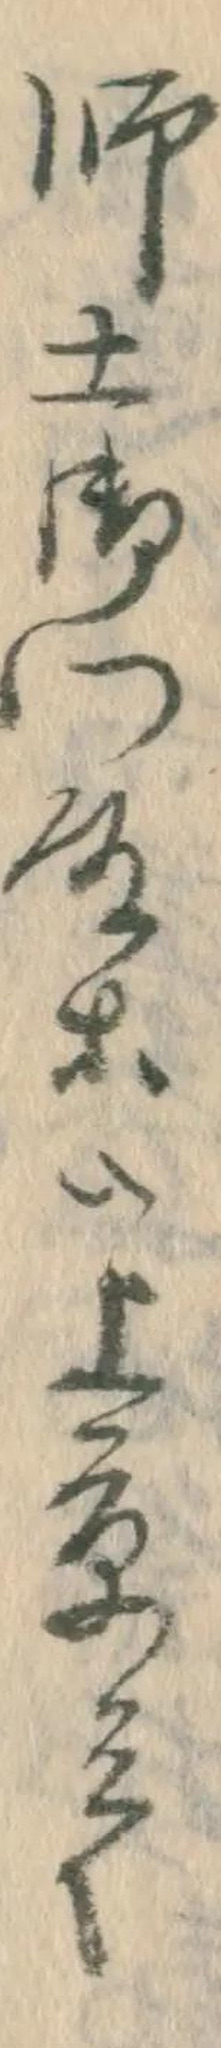師土御門殿等御上京云々
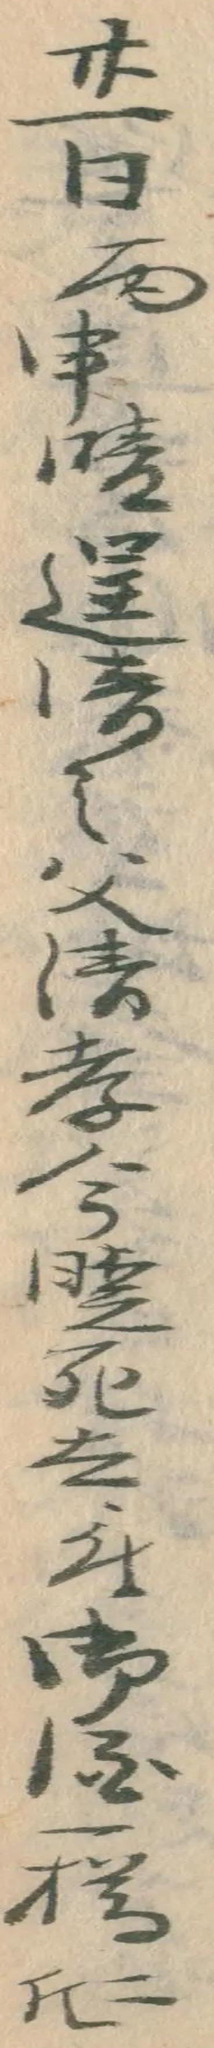廿一日丙申晴逞清之父清孝今暁死去ニ付御酒一樽肥

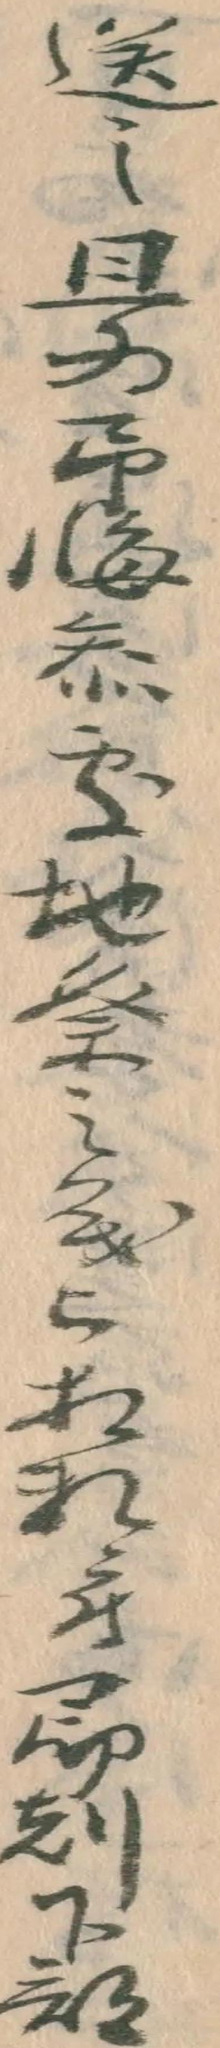送也旦為弔悔参處地祭之義被相頼ニ付即刻下部
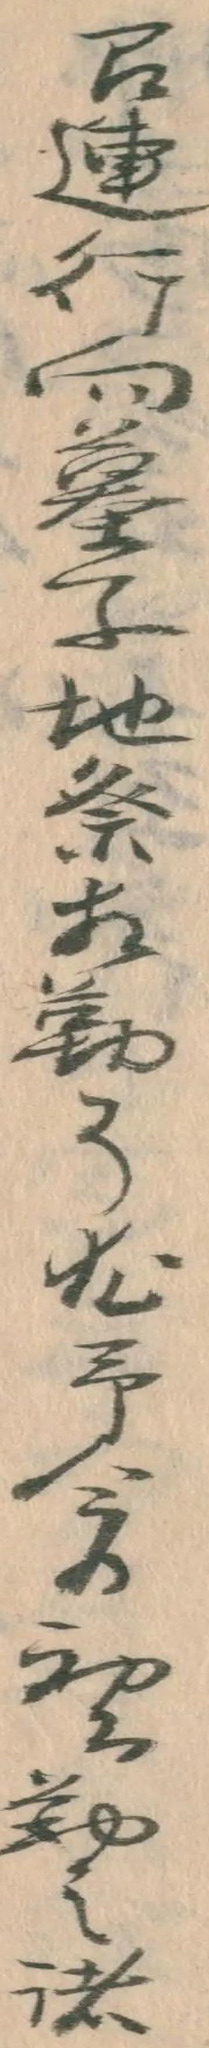召連行向墓所地祭相勤可尤予今日初而勤之諸
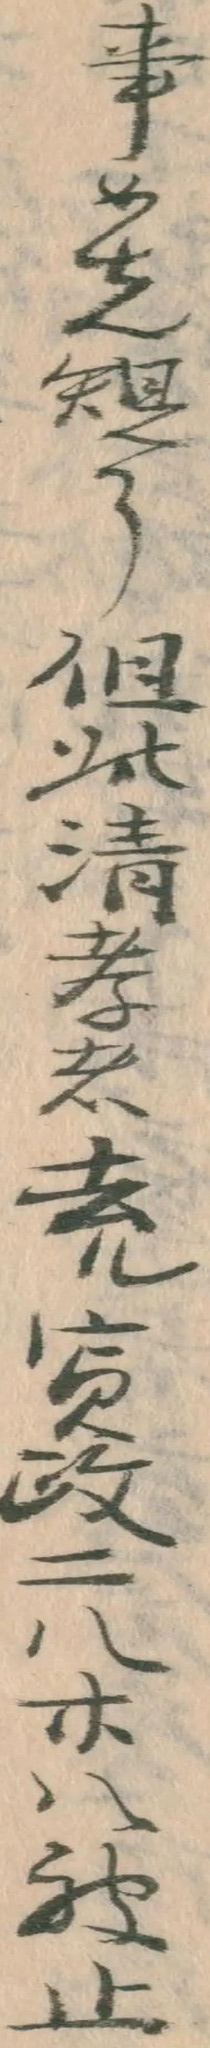事如先規了但此清孝者去ル寛政二八廿八被止
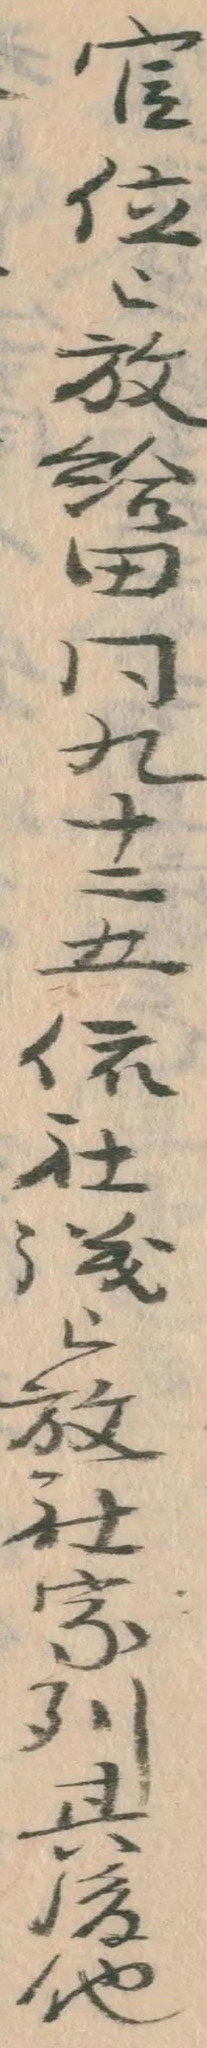官位被放給田同九十二五依社儀被放社家列其後他
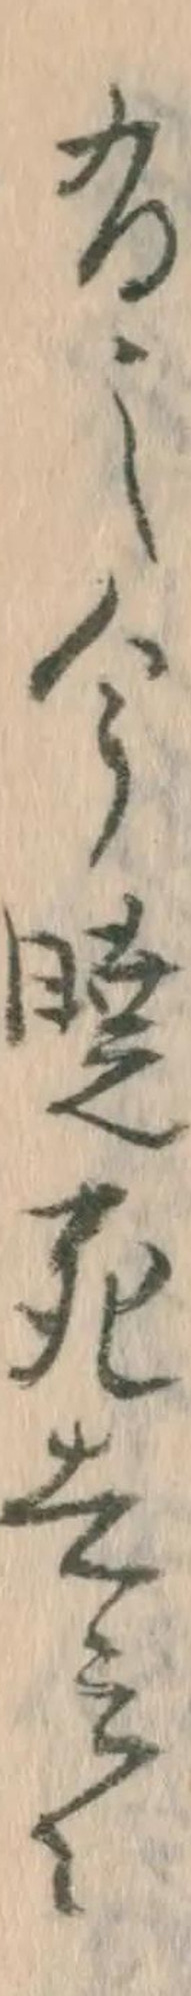有之今暁死去之云々
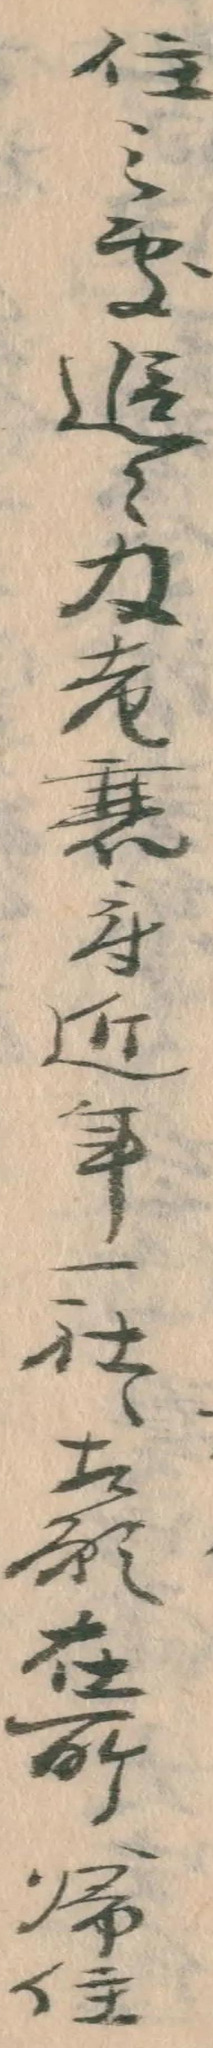住之處追々及老衰ニ付近年一社へ相願在所へ帰住
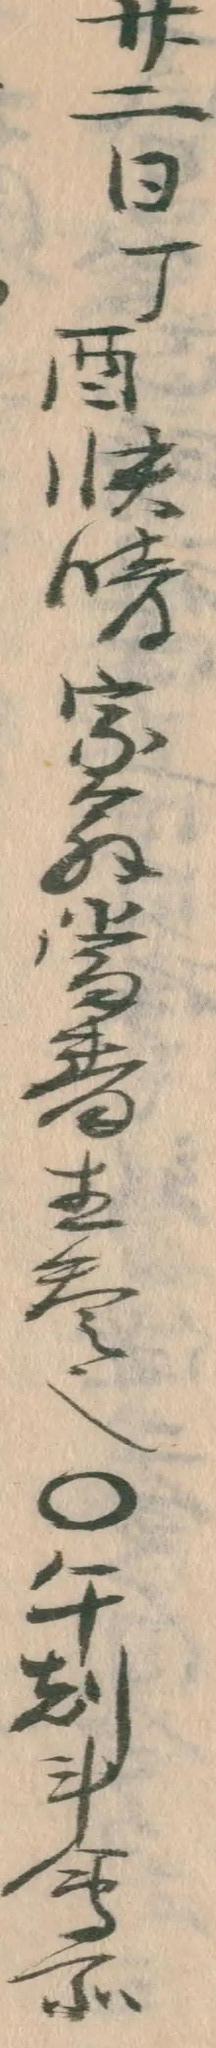廿二日丁酉快晴家翁當番直参也○午刻斗會所
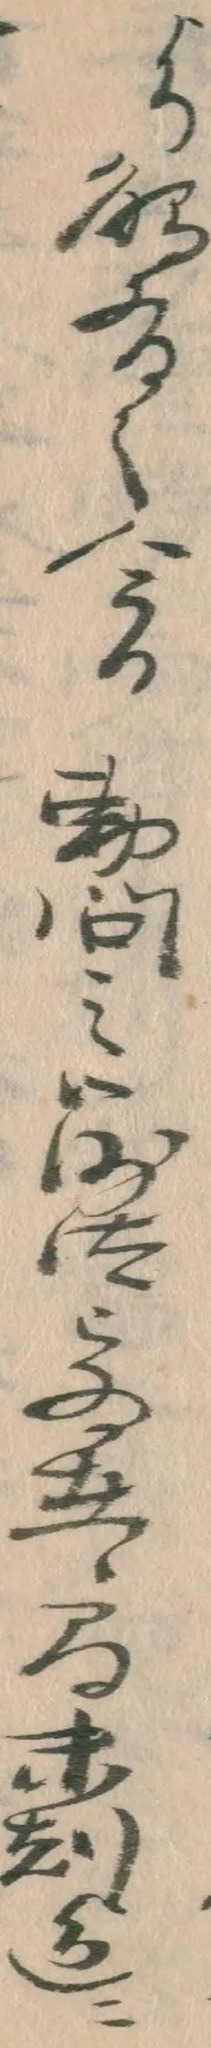より触有之今日勅問之御沙汰被為在候間未刻迄ニ
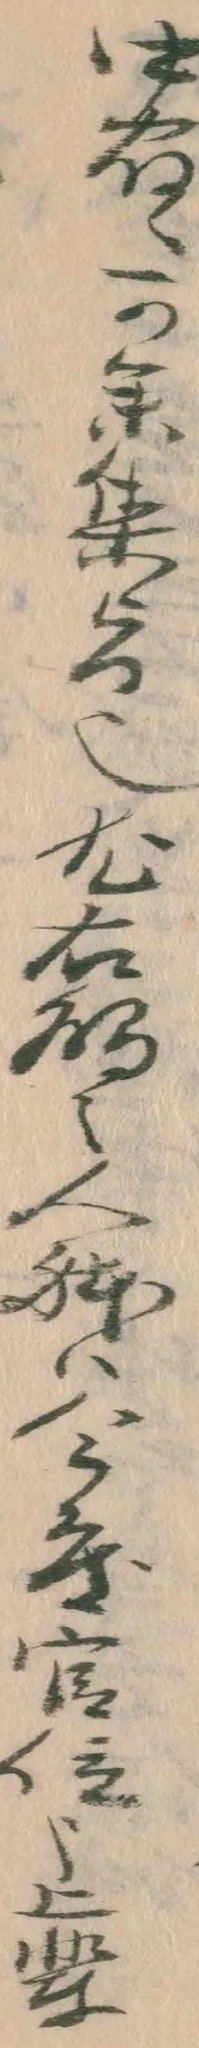中宿へ可参集旨也尤右触之人躰ハ今度官位之上輩
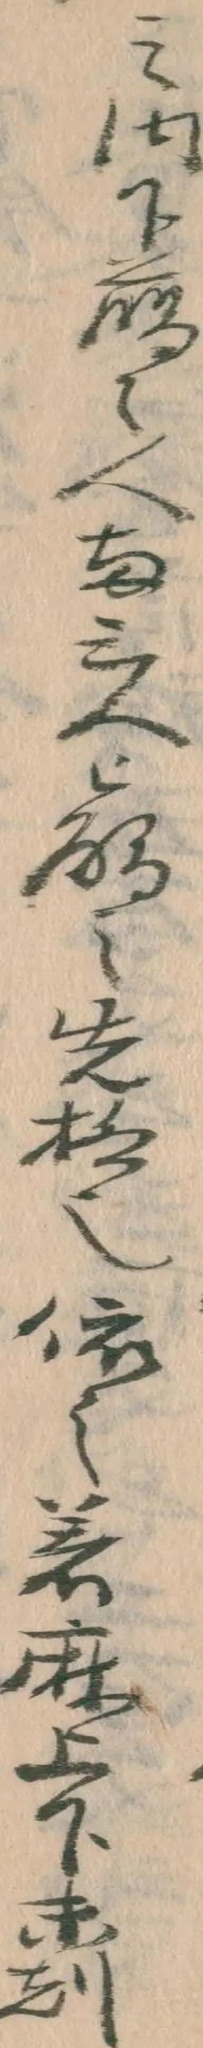之内下臈之人両三人被触之先格也依之着麻上下未刻
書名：賀茂社記録. 第63冊
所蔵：国立国会図書館 National Diet Library, JAPAN
